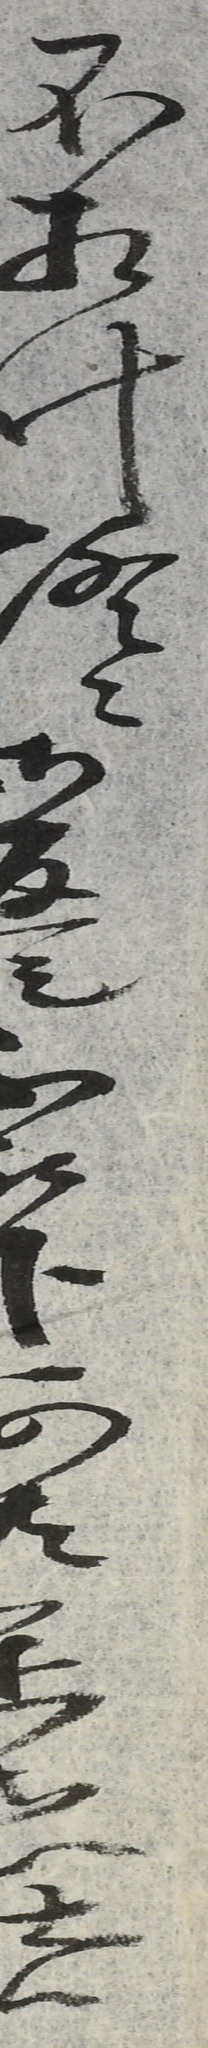不相叶終ニ御返シ不被下何共迷惑仕候

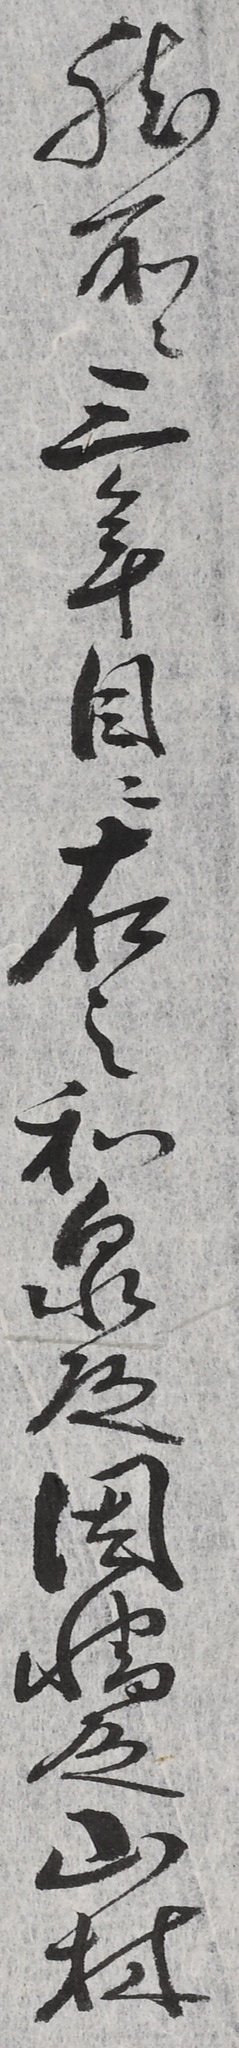然所ニ三年目ニ右之和泉殿因幡殿山林
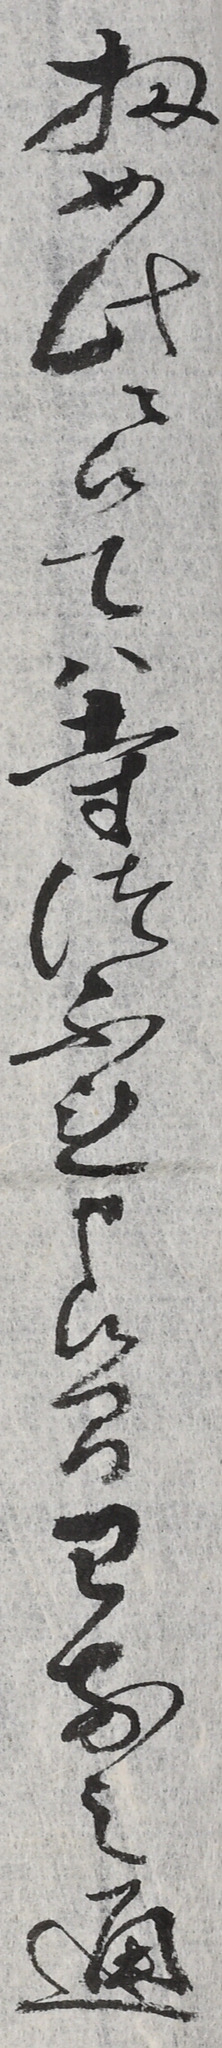為如此ニ候てハ寺つふれ申候間已前之通
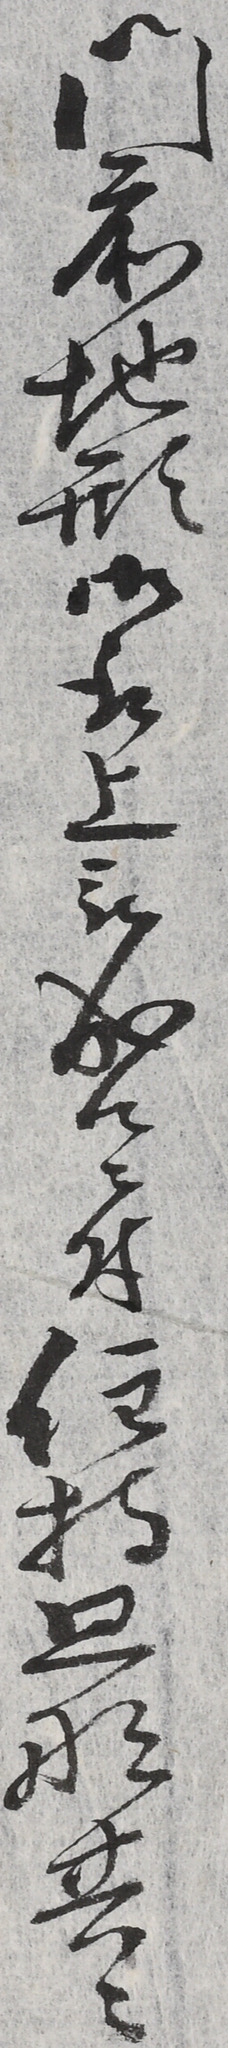門前地形御取上被成候ニ付住持旦那共々
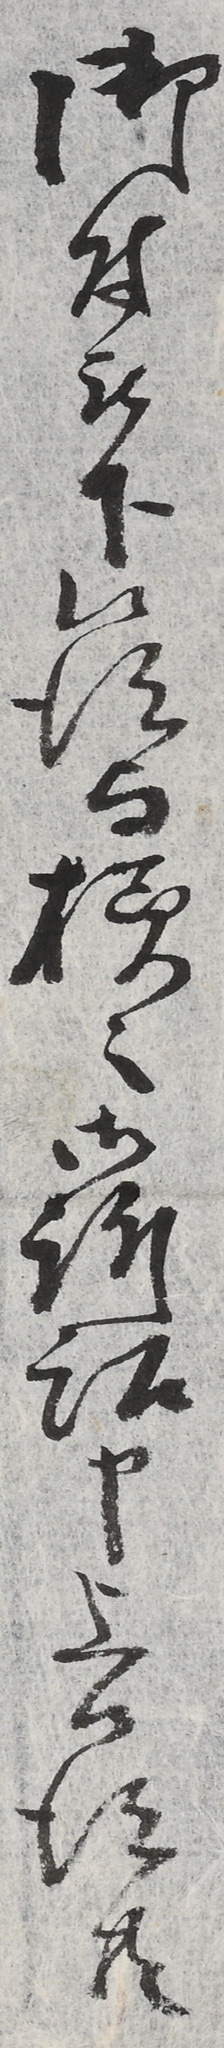御付被下候得与様々御訴訟申上候得共
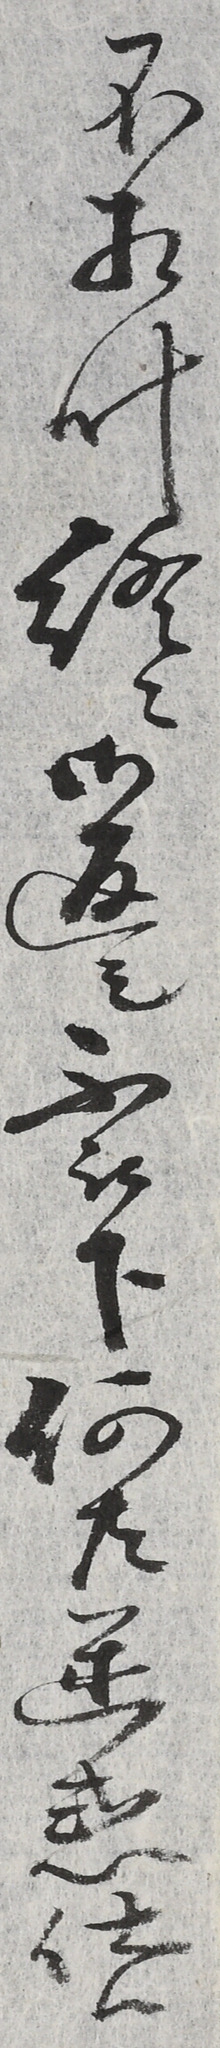不相叶終ニ御返シ不被下何共迷惑仕候
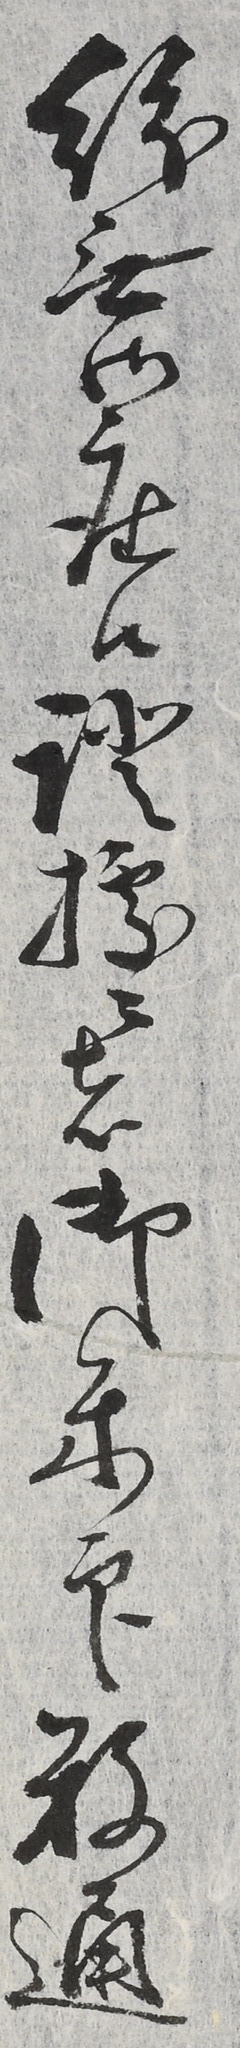紛無御座候証拠ニ者御朱印数通
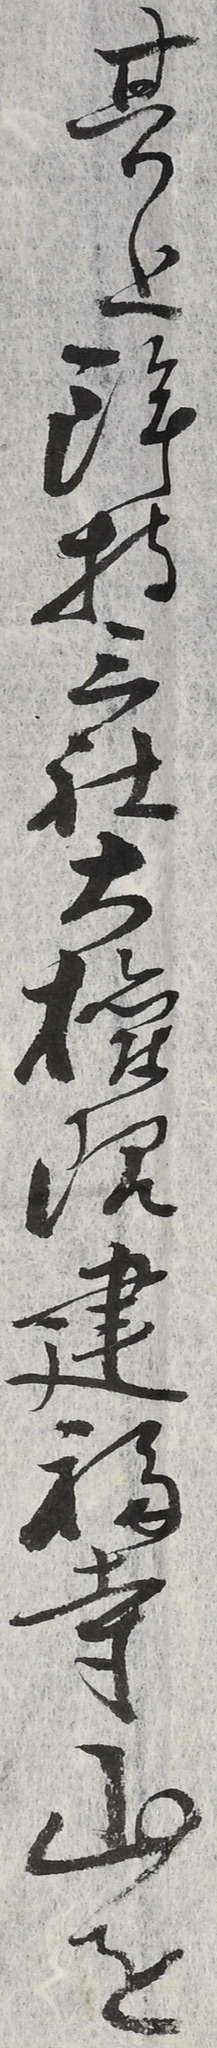其上鉾持三社大権現建福寺山を
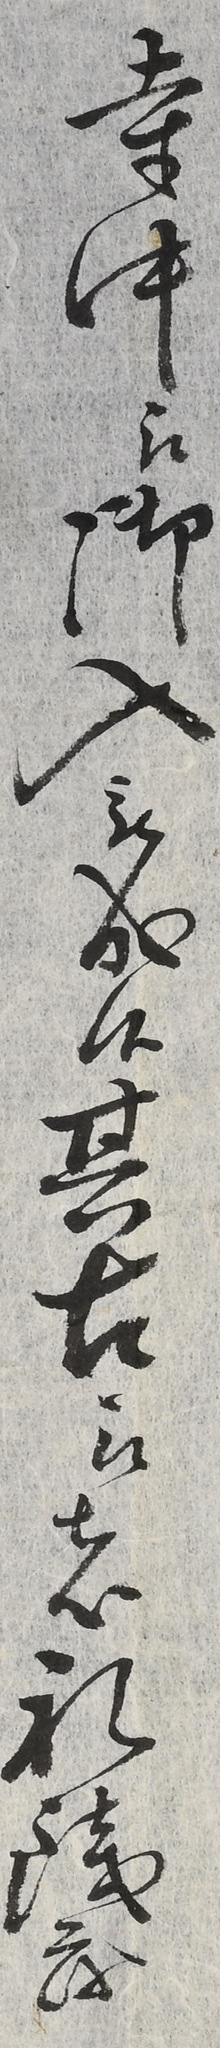寺中江御入被成候其古江者礼銭茂
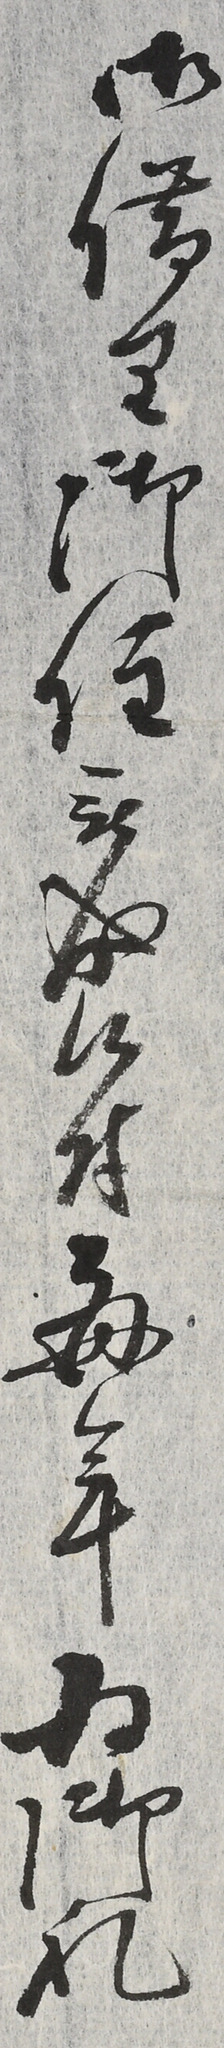御借り御住被成候付毎年為御礼
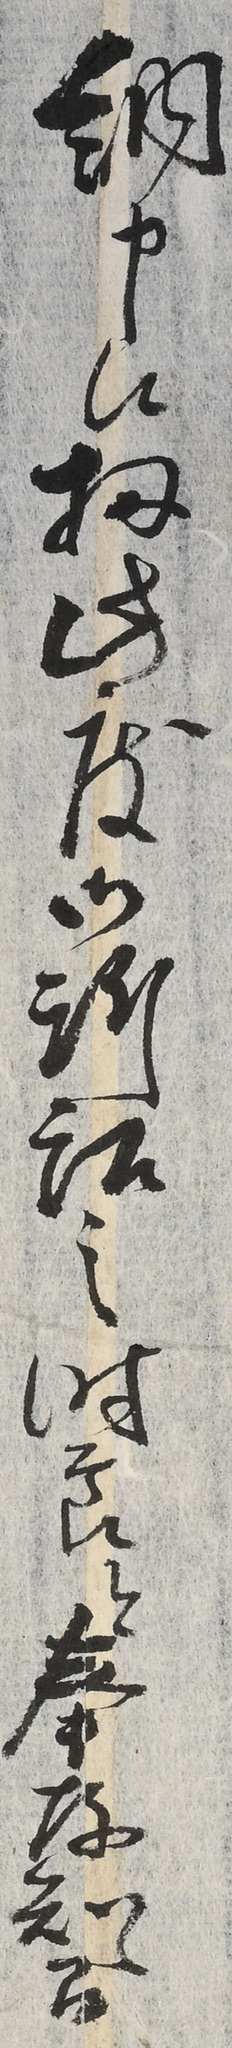納申候扨此度御訴訟之時節と奉存知候間
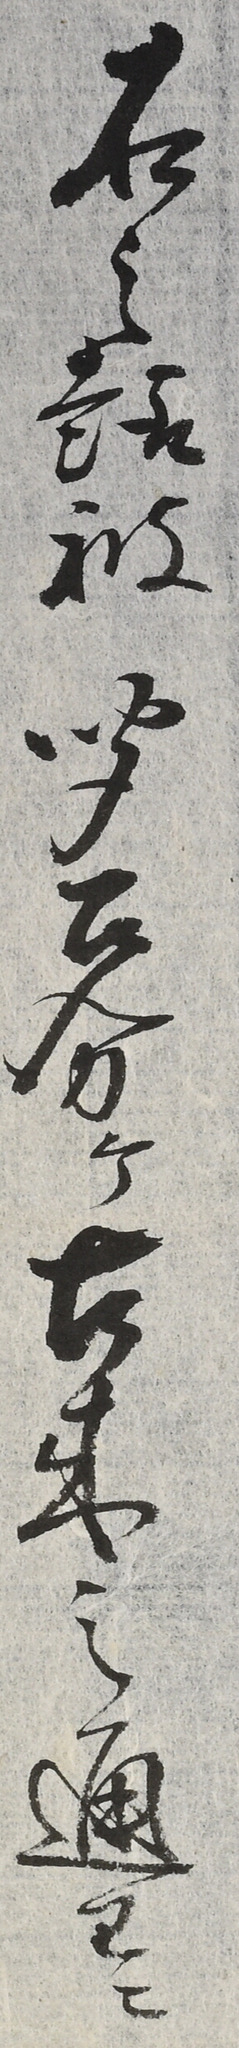右之趣被聞召分ヶ古来之通りニ
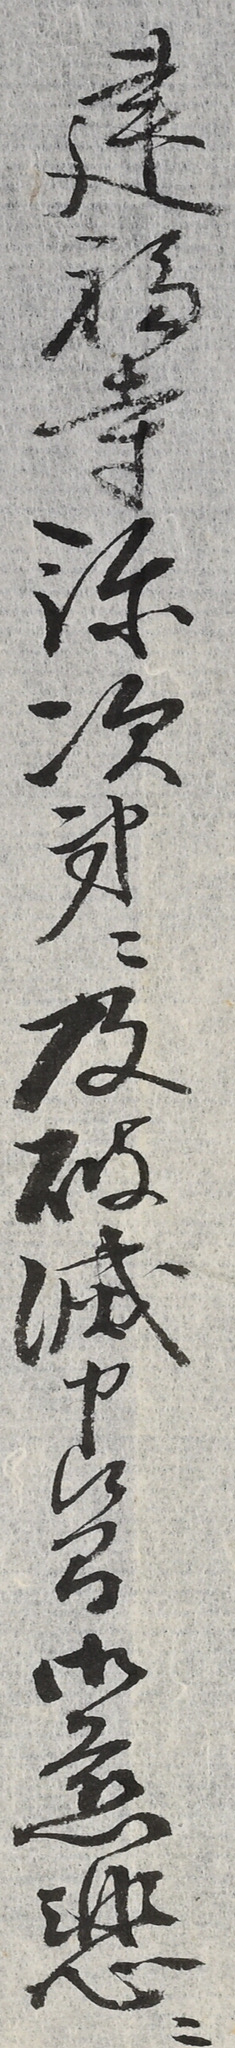建福寺弥次第ニ及破滅申候間御慈悲ニ
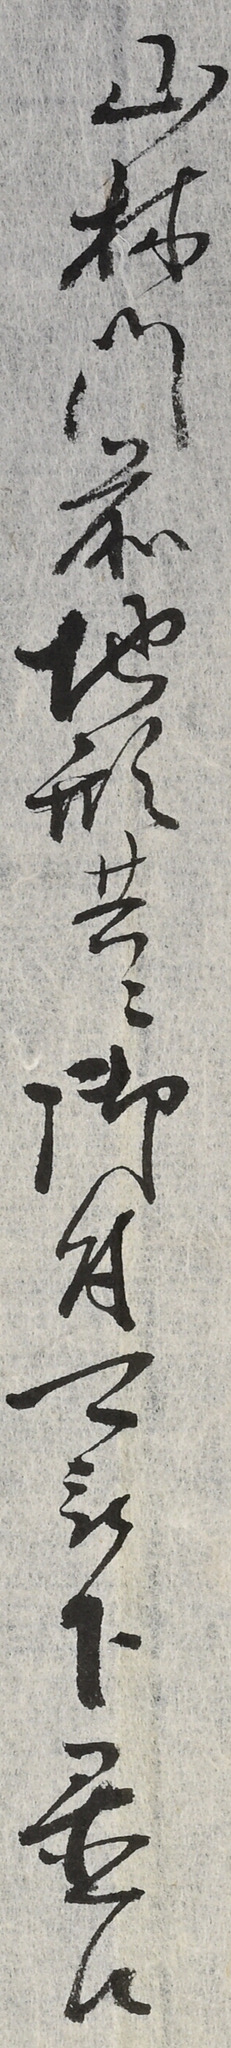山林門前地形共ニ御付可被下置候
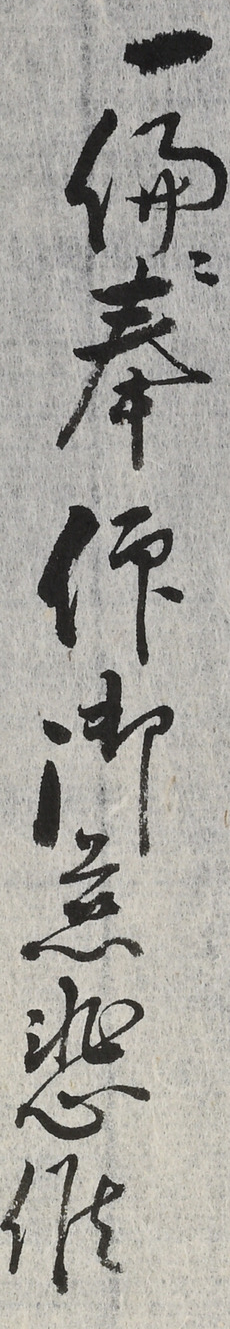一偏ニ奉仰御慈悲候
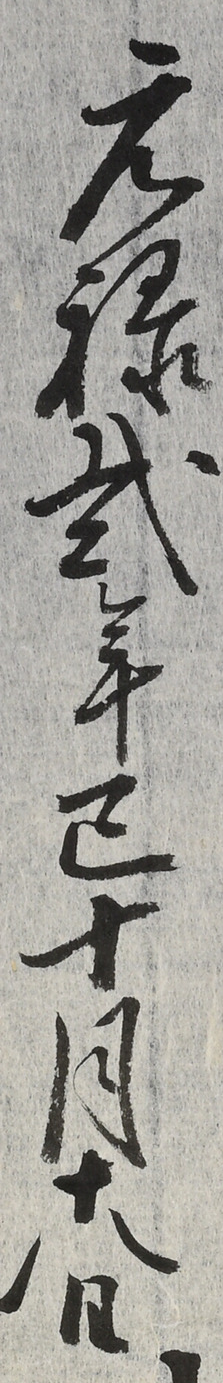元禄弐年巳十月十八日
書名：旧記
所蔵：伊那市立高遠町図書館・合同会社AMANE
